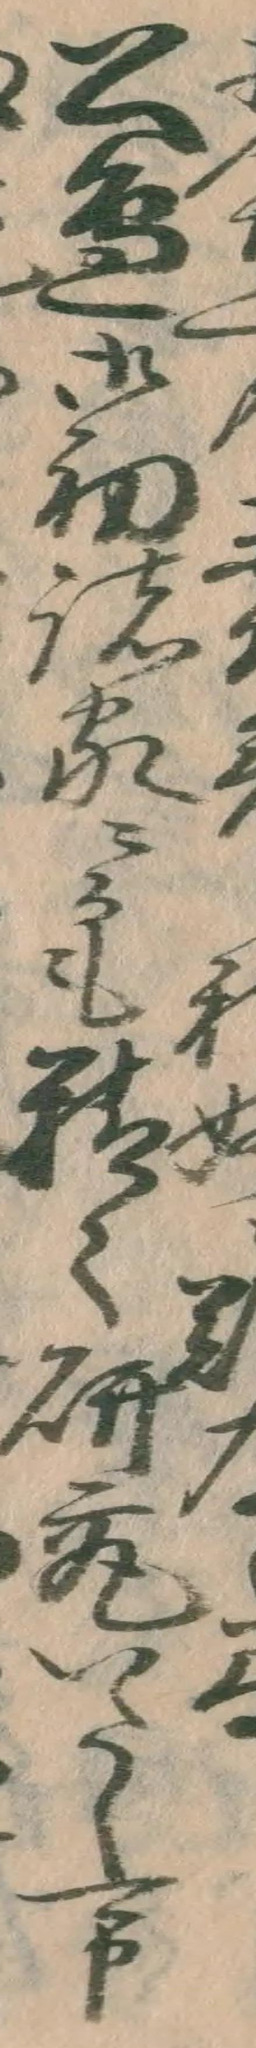公邊御初諸家ニ而も精々研究いたし可申
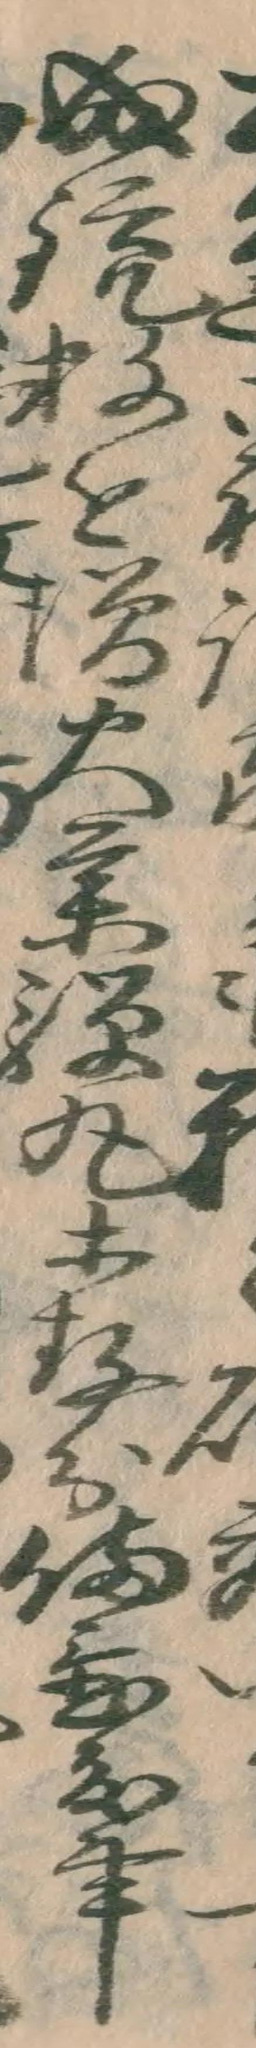成銃数を増火薬弾丸等存分備置度事
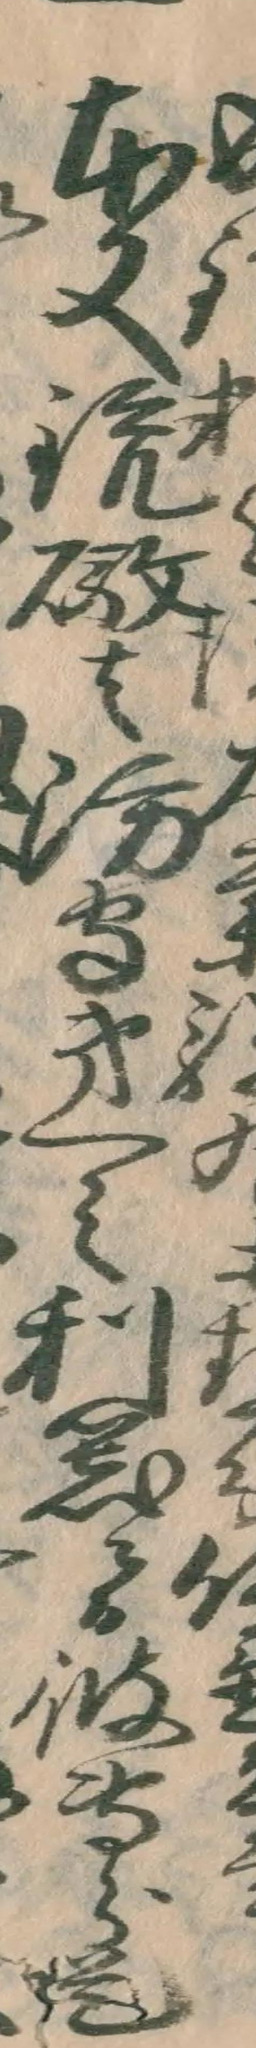一本文銃礮者防守第一之利器ニ而彼専ら是
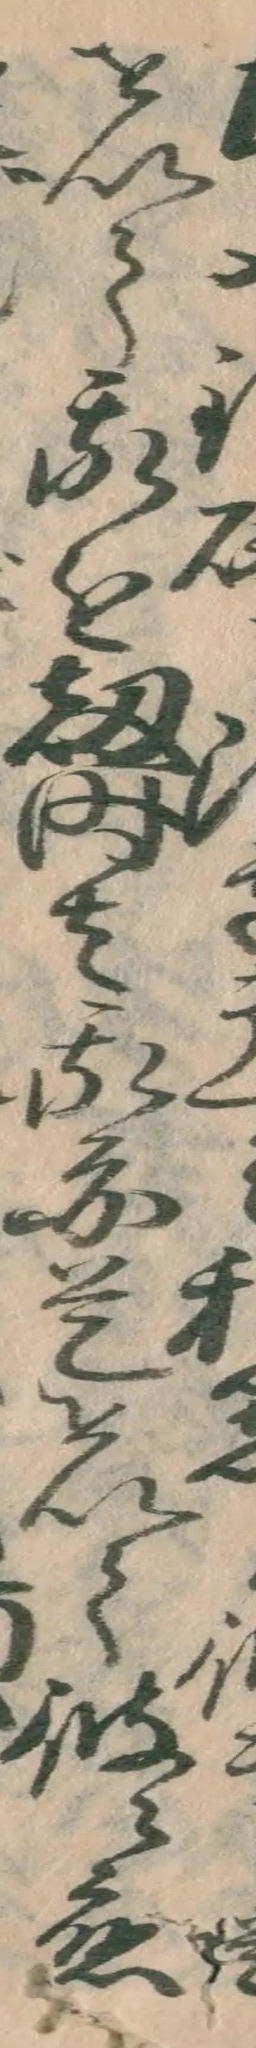を以て我を刧時者我亦是を以て彼ニ應
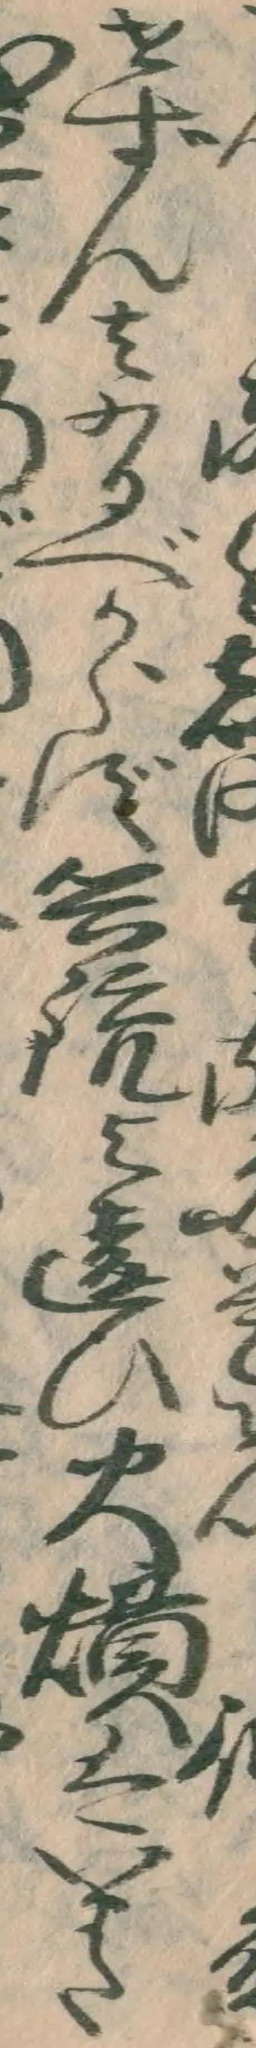せずん者有べからず兵銃と違ひ火憤はいまた
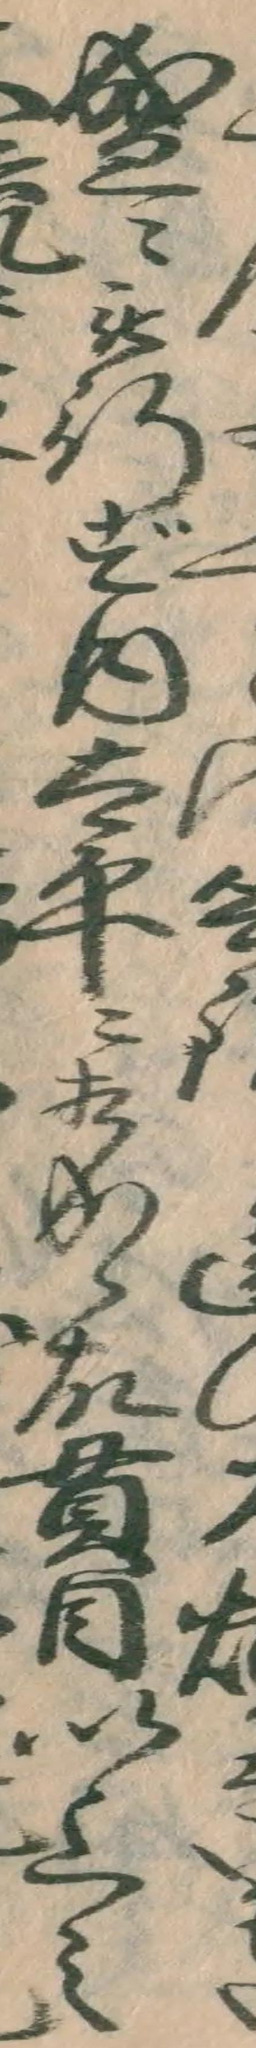盛ニ被行ず内太平ニ相成候故貫目以上之
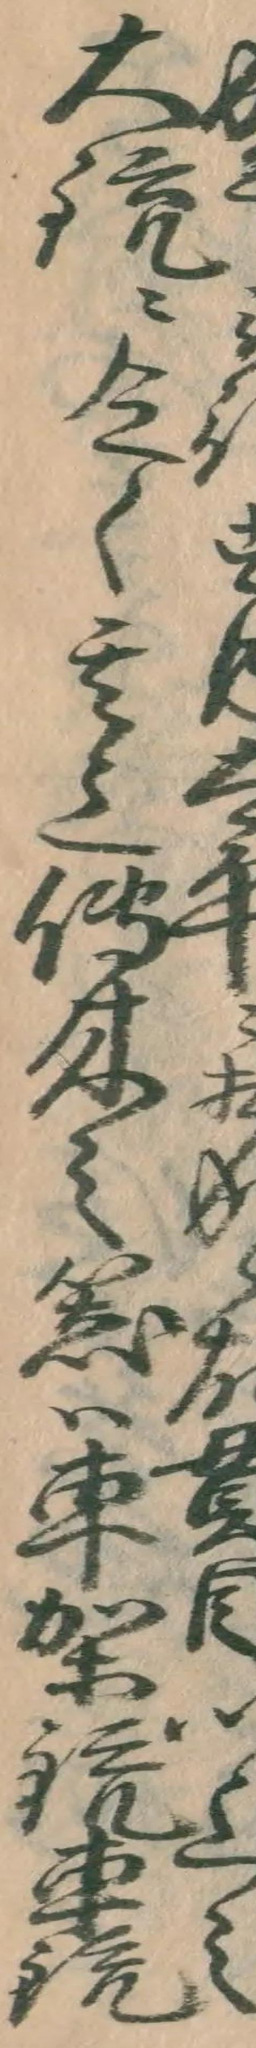大銃ニ全く其上伝来之器ハ車架銃車銃

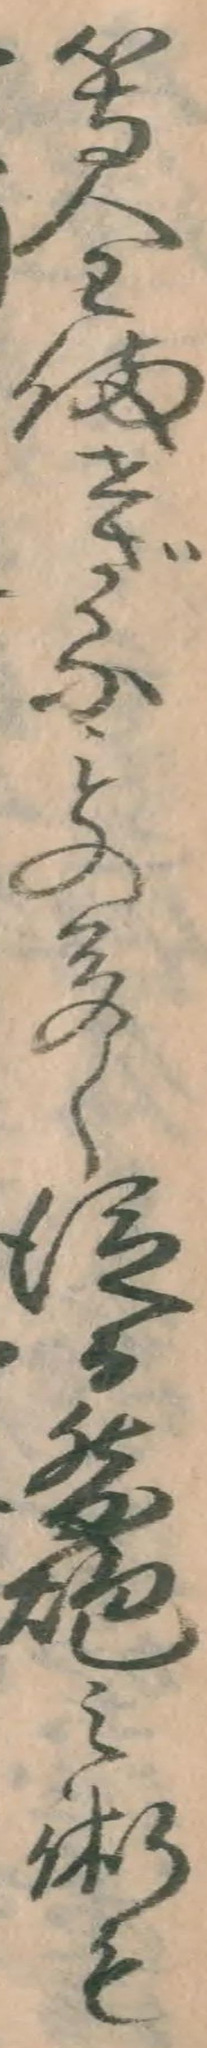等全備せざるもの多く従而発砲之術も
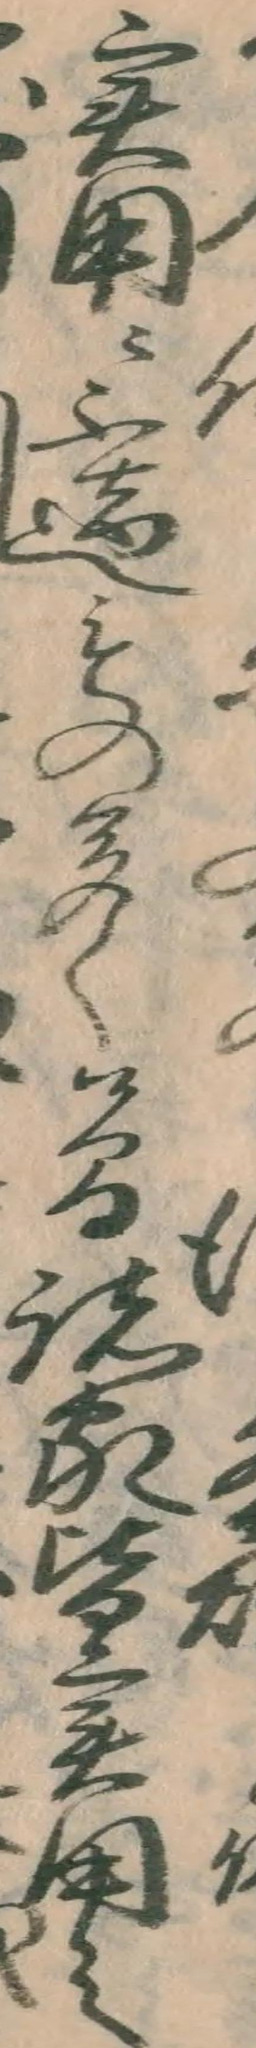実用ニ不適もの多く候間諸家皆実用之
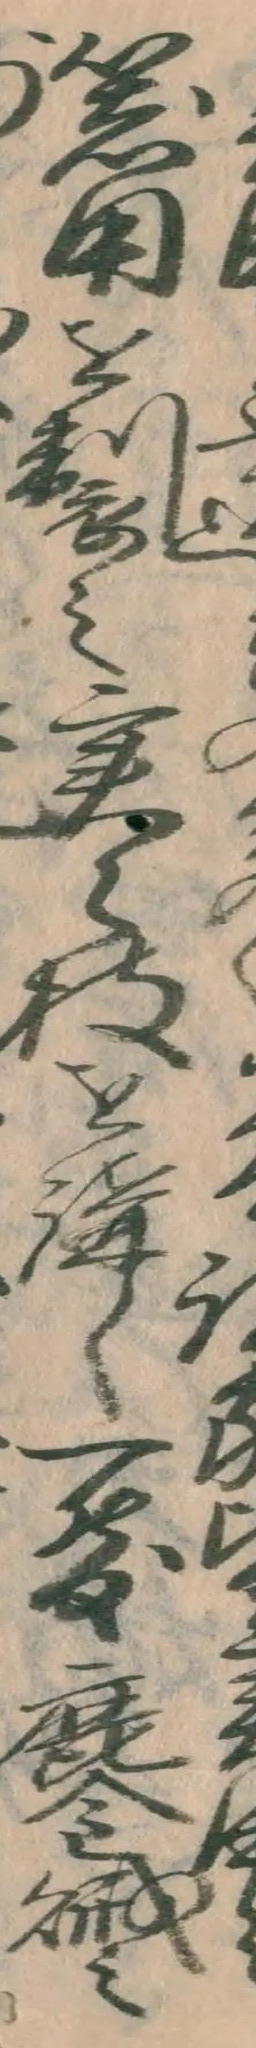器用を製て実之技を講し一発鏖賊之
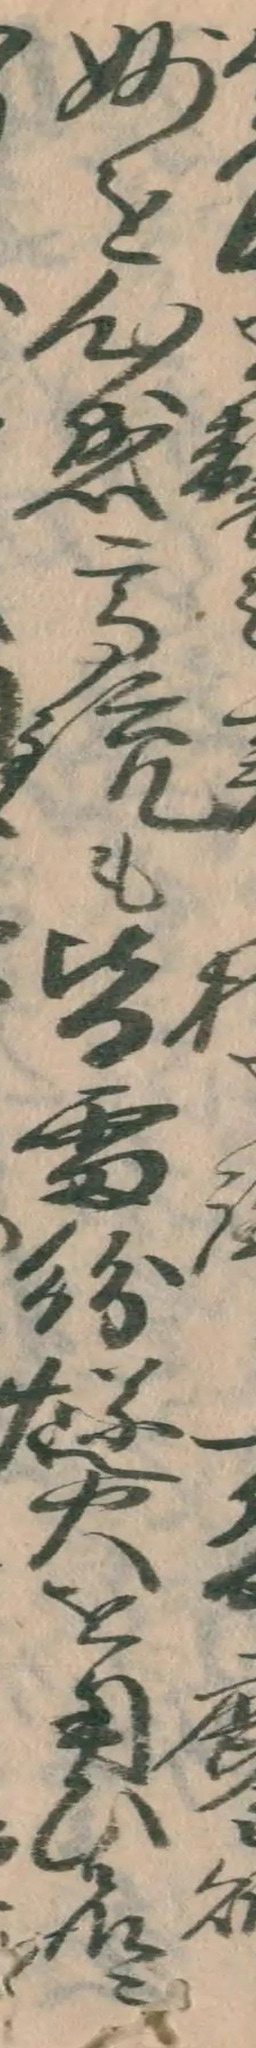妙を心懸高銃も皆雷粉燧火を用ひ候様ニ
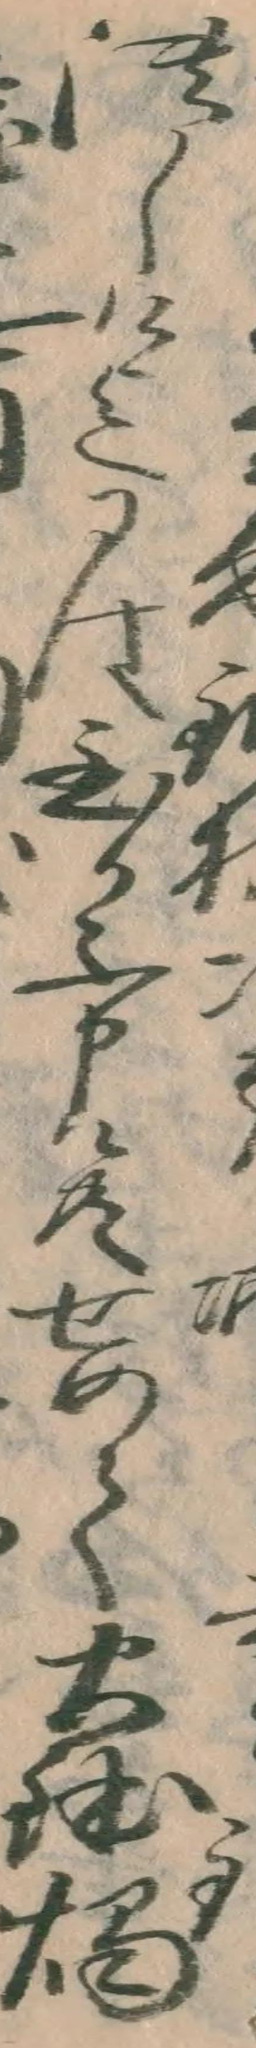潰し候迄には至り不申候共せめて火鉢燭
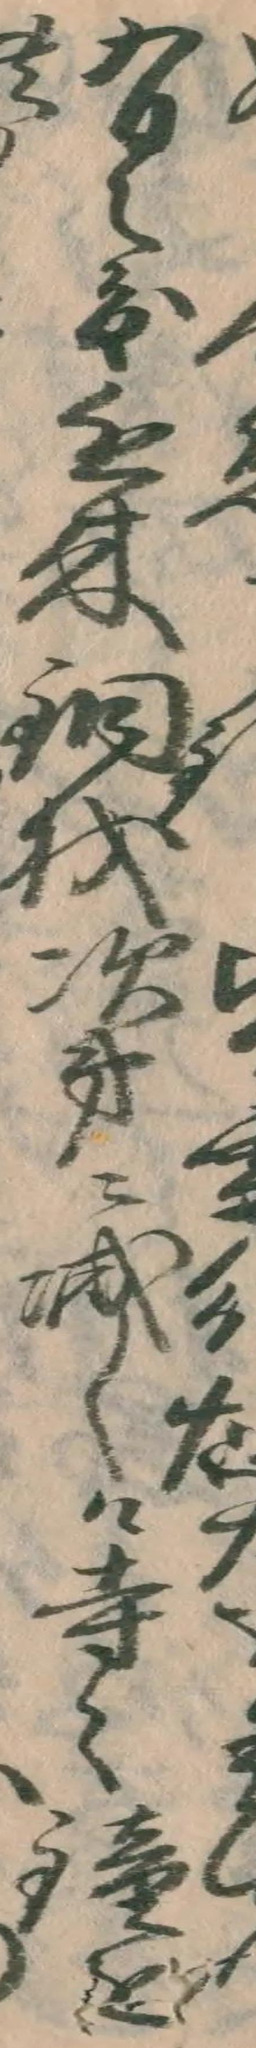有之度近来銅材次第ニ減し候寺之鐘を
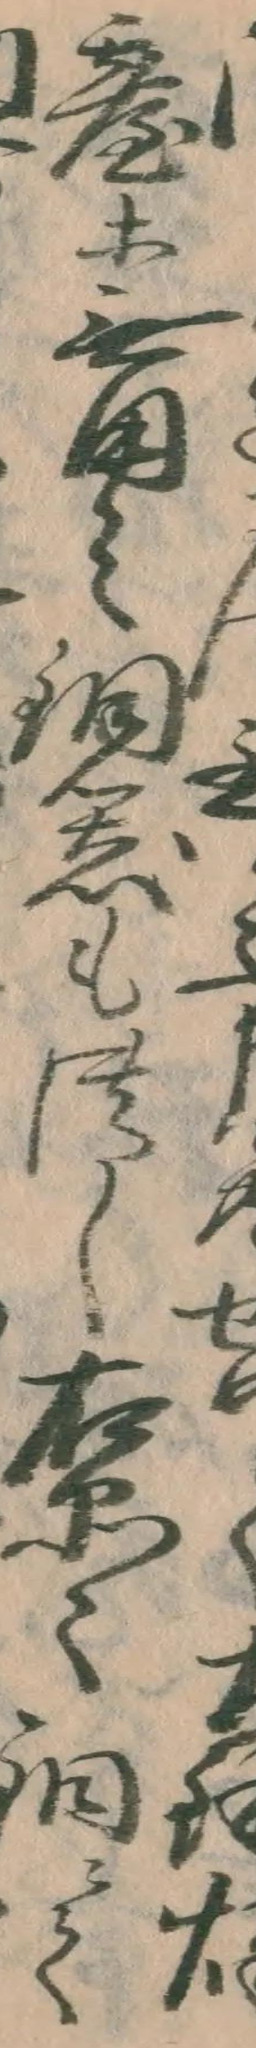臺等無用之銅器も潰し右品々銅ニて
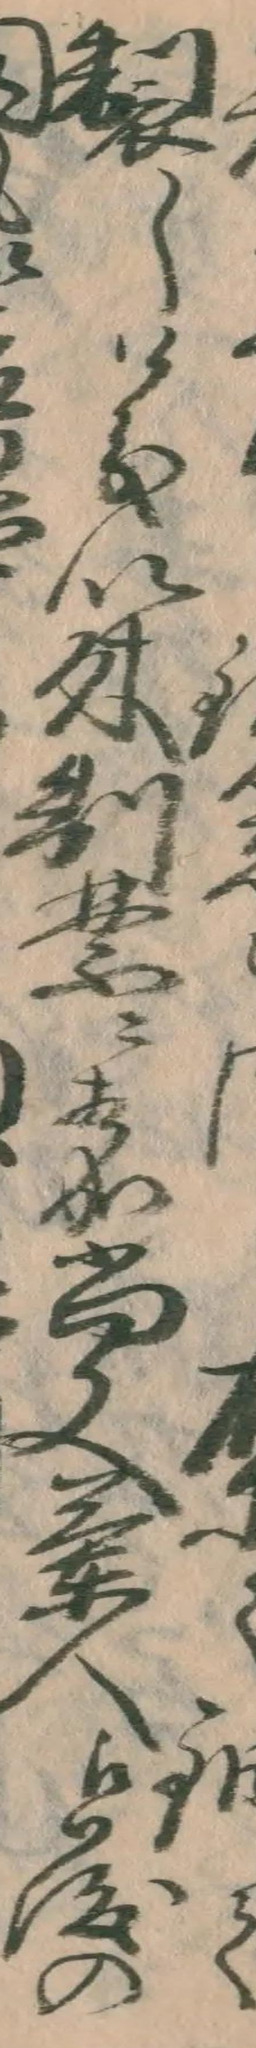製し候義以来制禁ニ相成尚又蘭人江御渡の
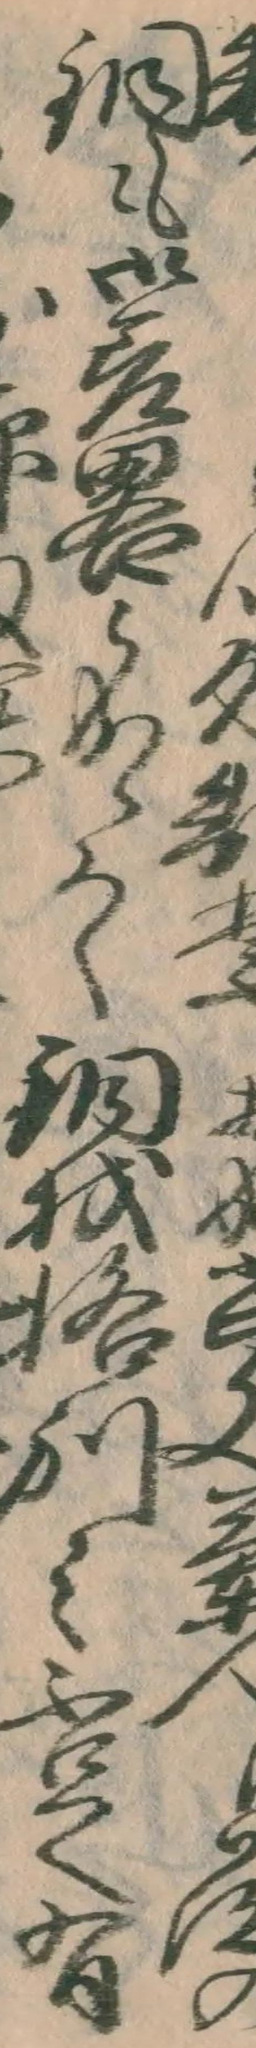銅も御差略被成候ハヽ銅材格別之不足有
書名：麗斎叢書. 20
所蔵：国立国会図書館 National Diet Library, JAPAN
